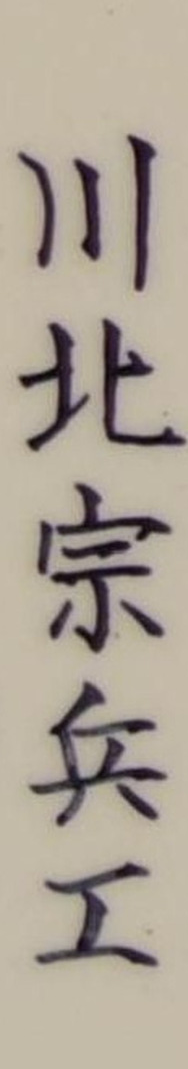川北宗兵エ
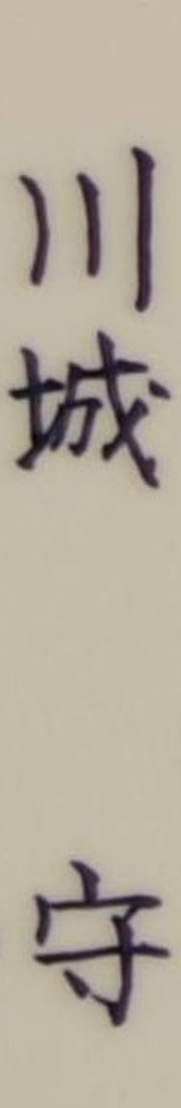川城守

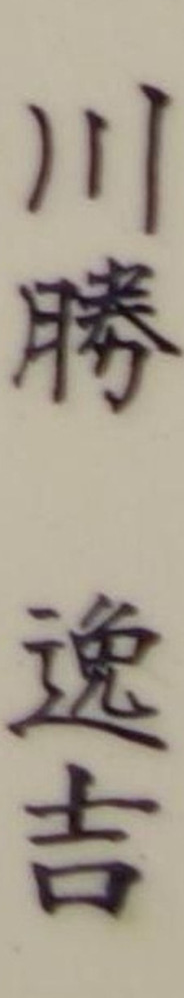川勝逸吉
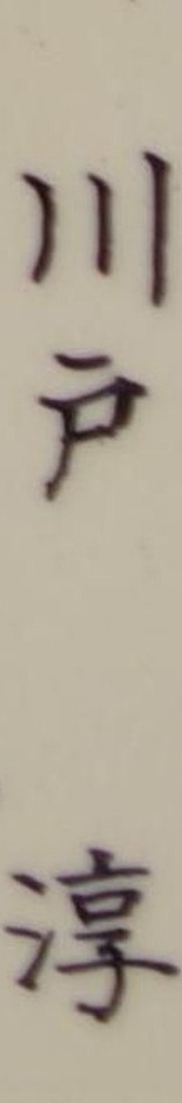川戸淳
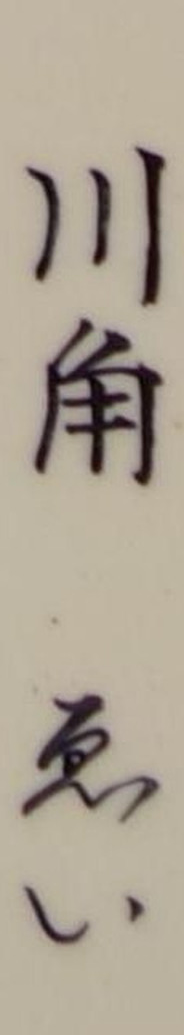川角ゑい
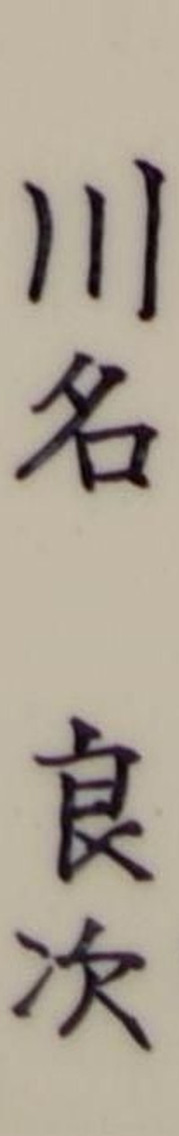川名良次
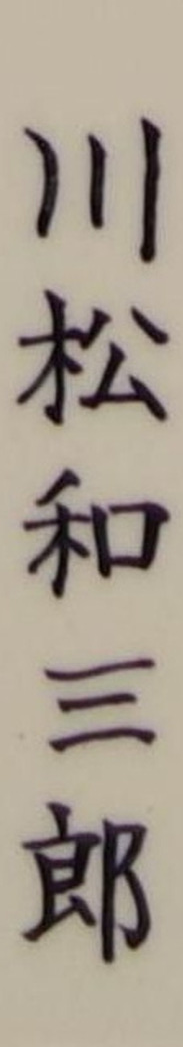川松和三郎
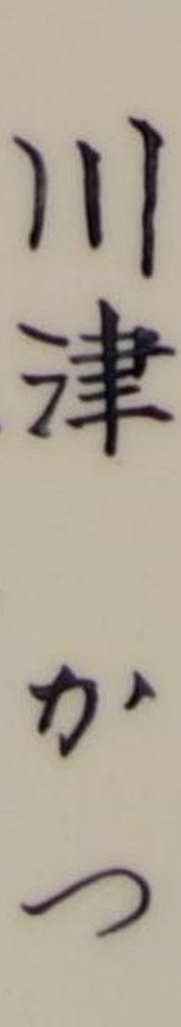川津かつ
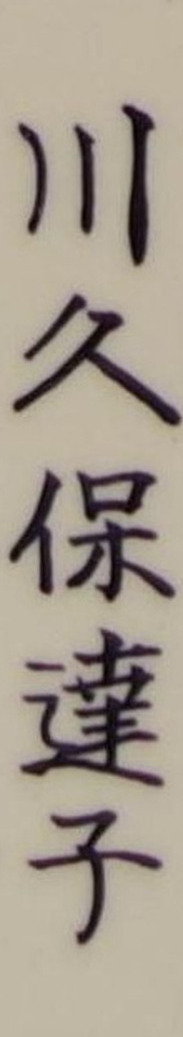川久保達子
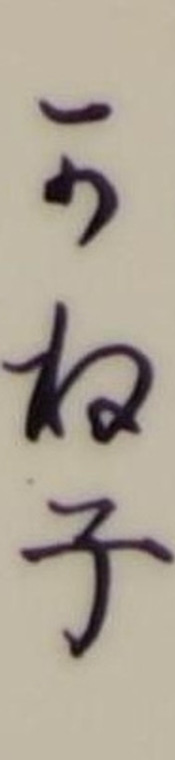かね子
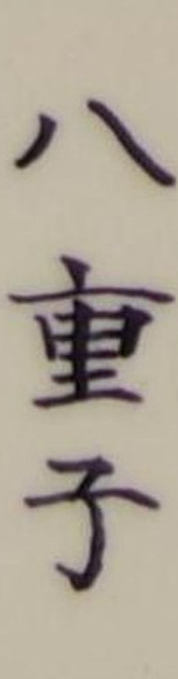八重子
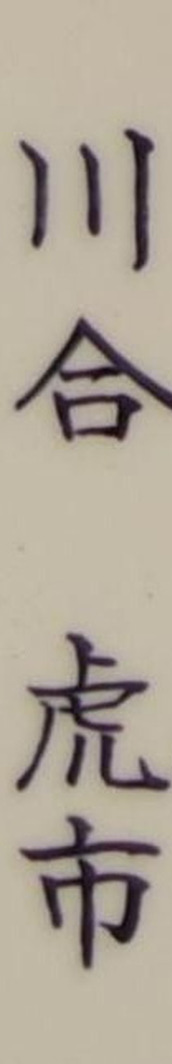川合虎市
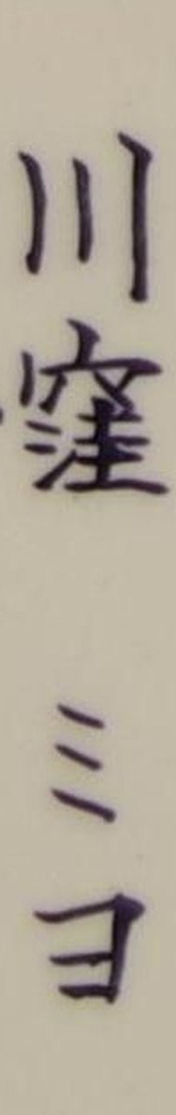川窪ミヨ
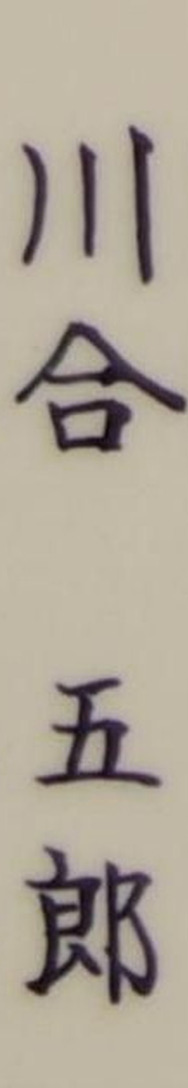川合五郎
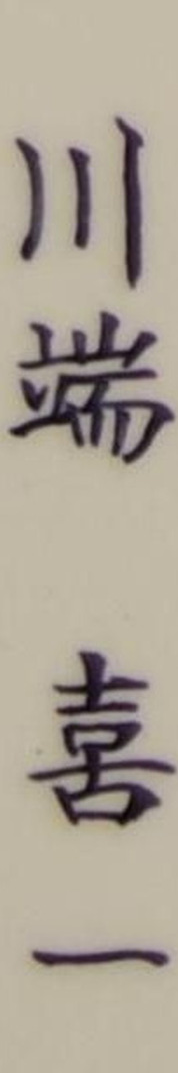川端喜一
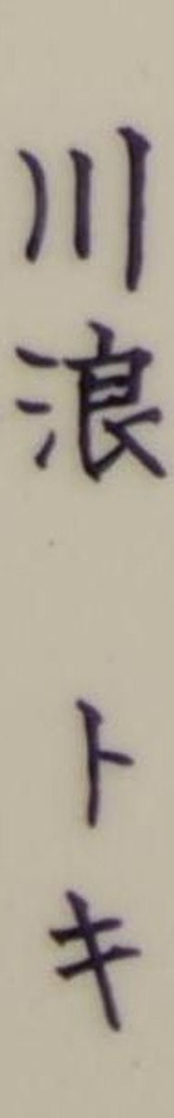川浪トキ
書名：M~S
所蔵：高野山金剛峯寺
